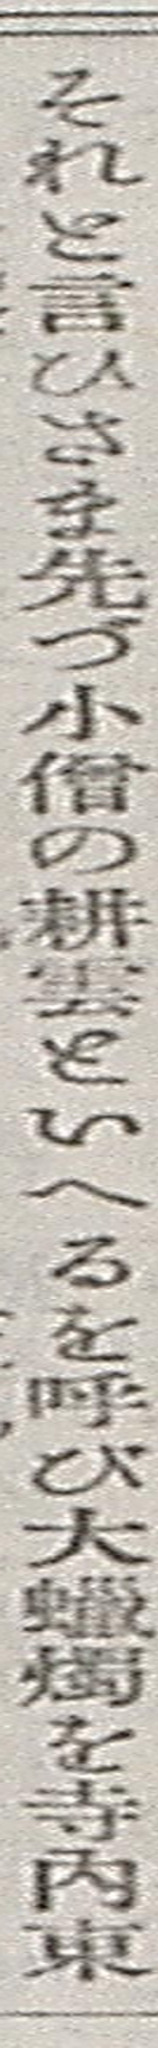それと言ひざま先づ小僧の耕雲といへるを呼び大蝋燭を寺内東
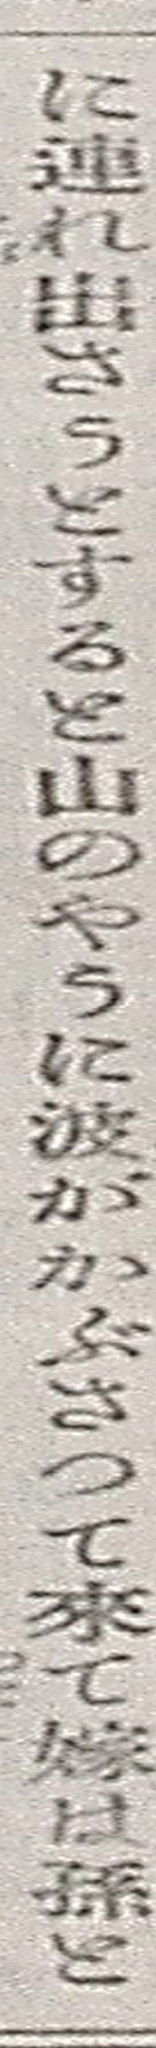に連れ出さうとすると山のやうに波がかぶさつて来て嫁は孫と
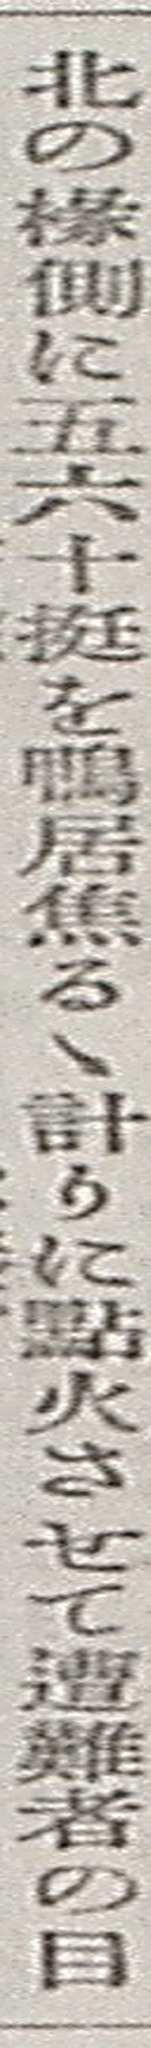北の縁側に五六十挺を鴨居焦るゝ計りに点火させて遭難者の目
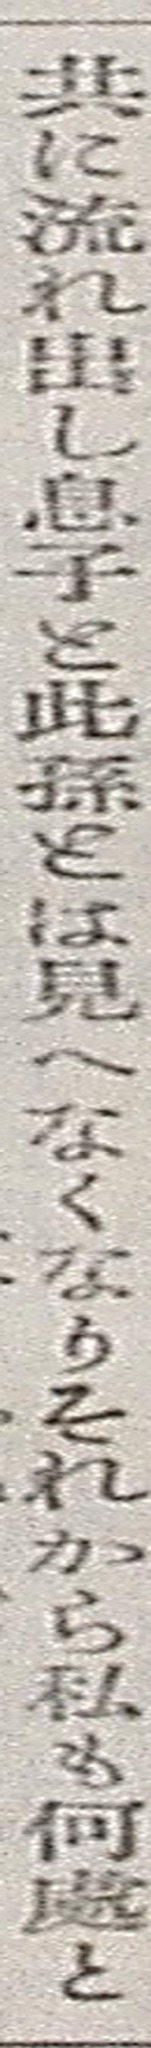共に流れ出し息子と此孫とは見へなくなりそれから私も何処と
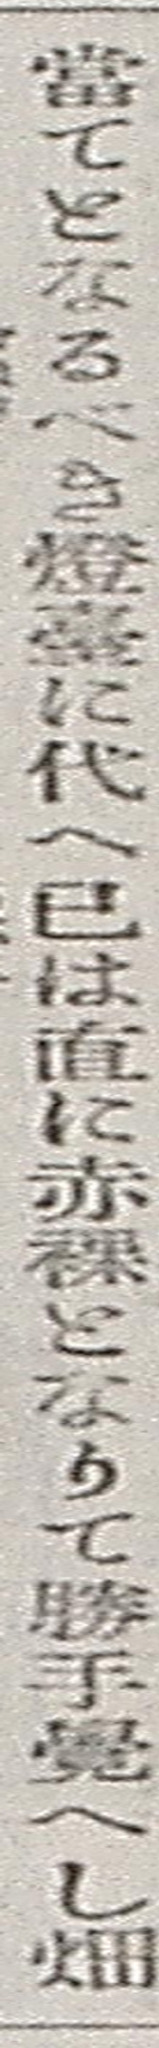当てとなるべき灯台に代へ己は直に赤裸となりて勝手覚へし畑
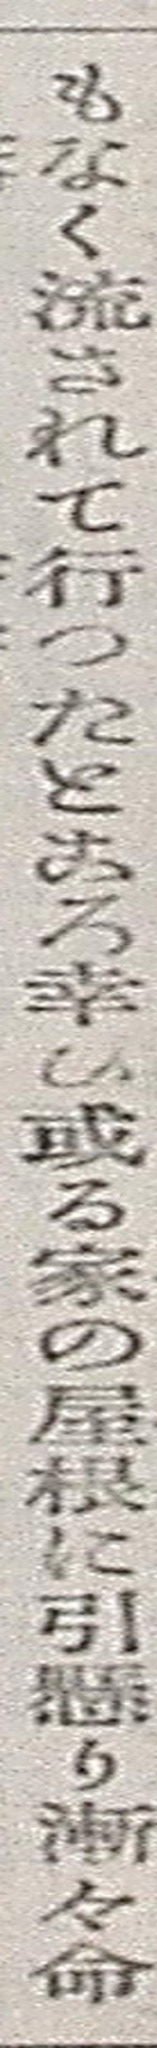もなく流されて行つたところ幸ひ或る家の屋根に引懸り漸々命
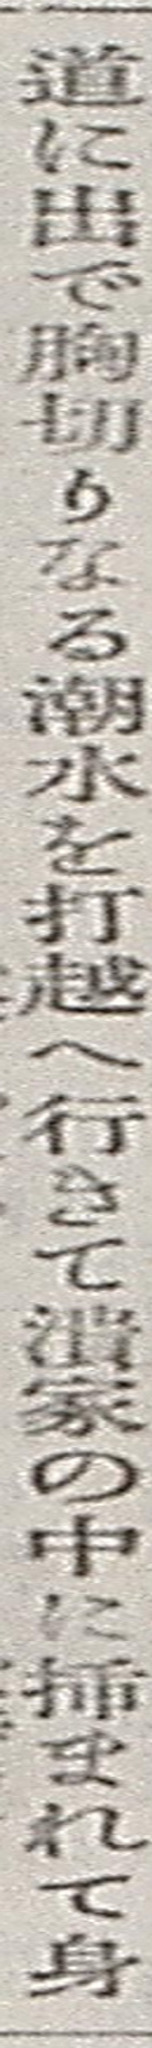道に出で胸切りなる潮水を打越へ行きて潰家の中に挿まれて身
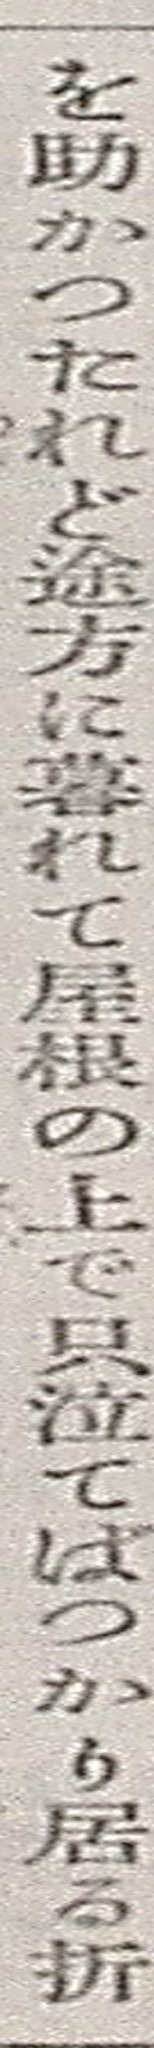を助かつたれど途方に暮れて屋根の上で只泣てばつかり居る折
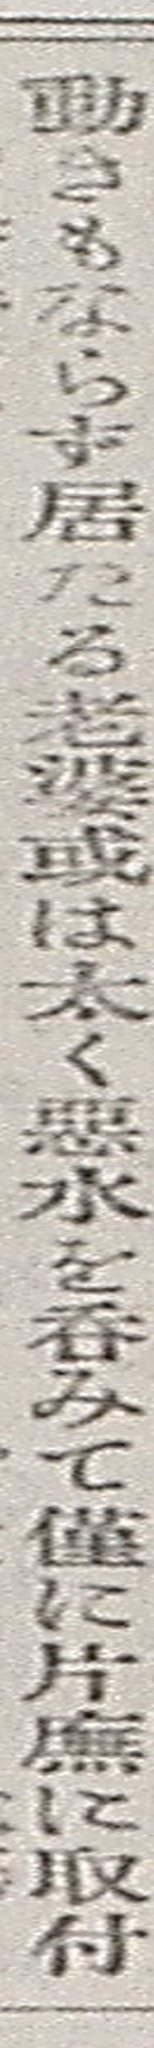動きもならず居たる老婆或は太く悪水を呑みて僅に片廡に取付
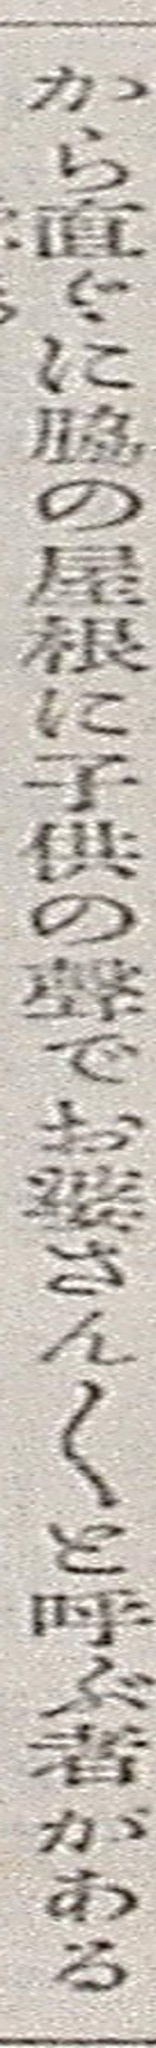から直ぐに脇の屋根に子供の声でお婆さん〳〵と呼ぶ者がある
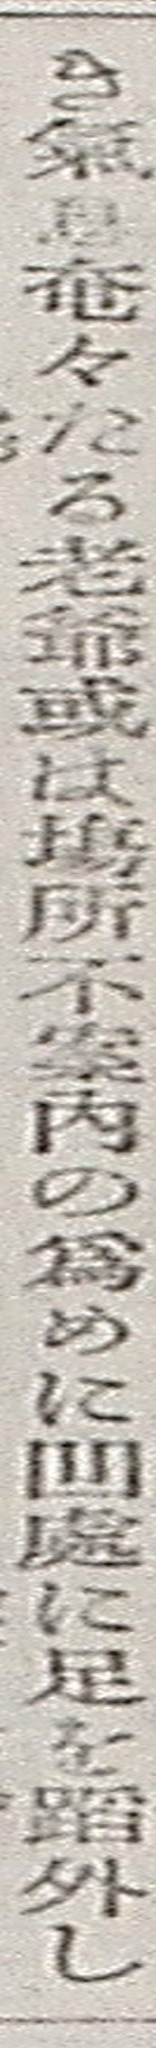き気息奄々たる老爺或は場所不案内の為めに凹処に足を踏外し
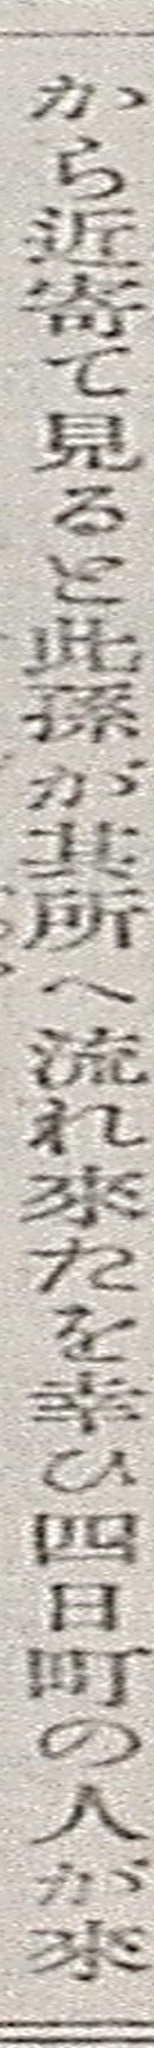から近寄て見ると此孫が其所へ流れ来たを幸ひ四日町の人が来
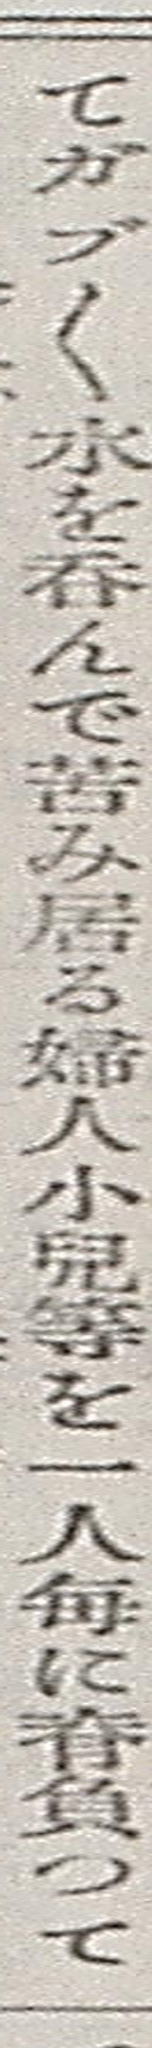てガブ〳〵水を呑んで苦み居る婦人小兒等を一人毎に脊負つて
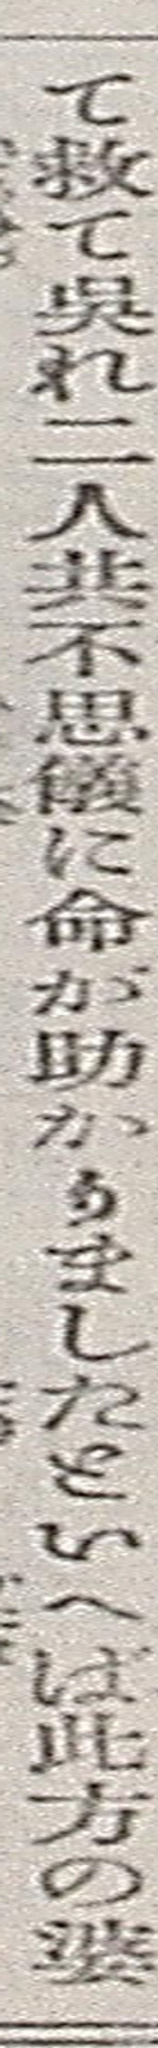て救て呉れ二人共不思儀に命が助かりましたといへば此方の婆
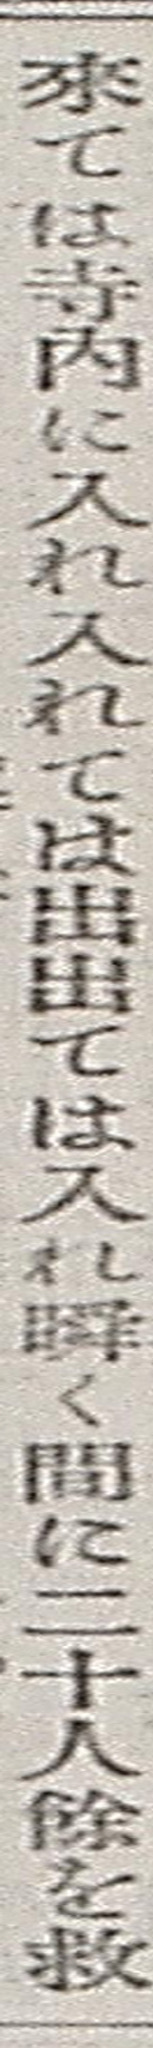来ては寺内に入れ入れては出出ては入れ瞬く間に二十人余を救
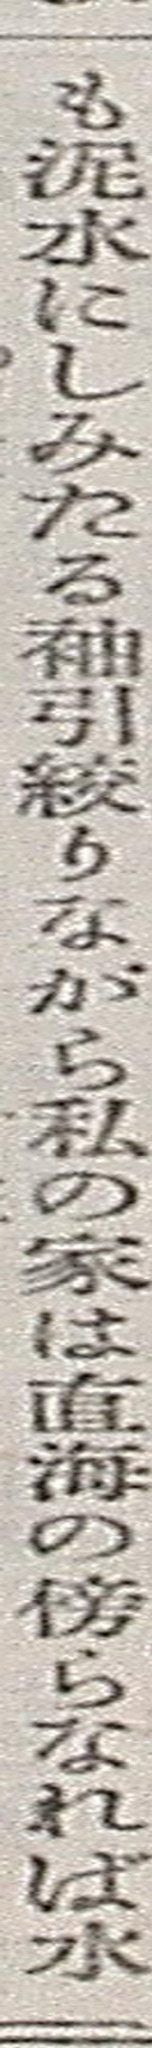も泥水にしみたる袖引絞りながら私の家は直海の傍らなれば水
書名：風俗畫報臨時増刊第百二十號　大海嘯被害録（下）
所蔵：東京大学地震研究所図書室 Earthquake Research Institute Library, The University of Tokyo, JAPAN
